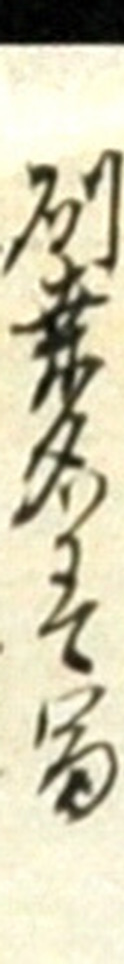州桑名にて富
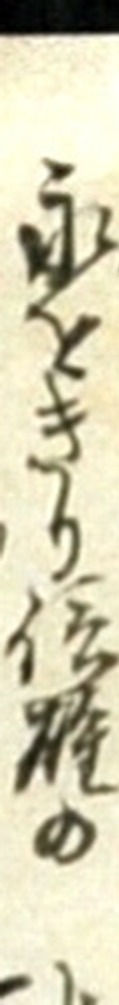永をきり信雄の
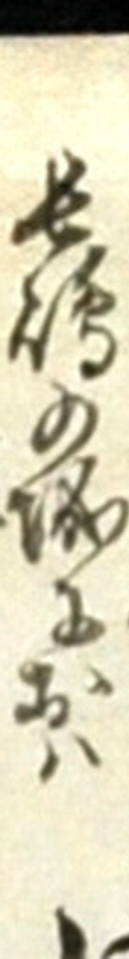長島の城におは
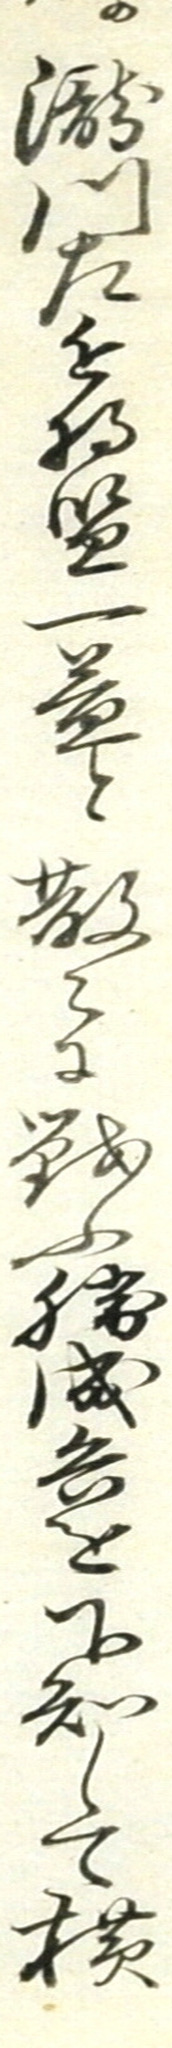瀧川左近将監一益と散々に戦ふ勝成兵を下知して横
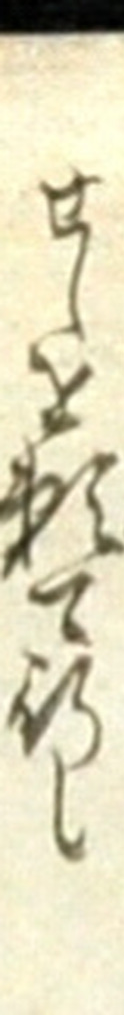せしを頼て行し
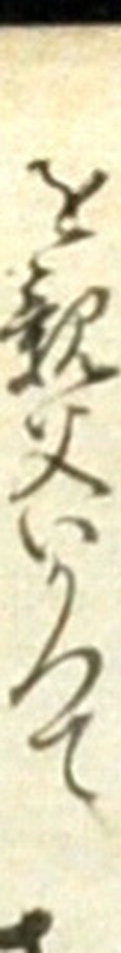を親父いかつて
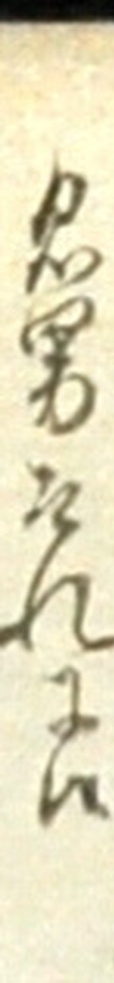忠男それに候
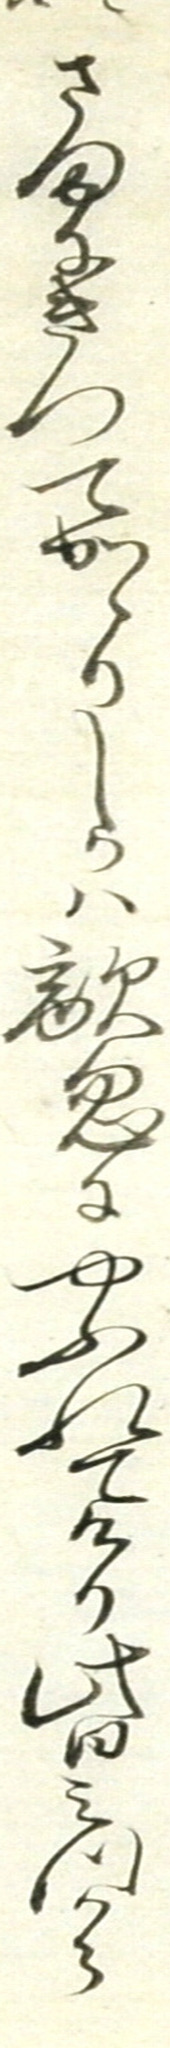さまにきつてかゝりしかは敵忽にやふれてけり此日みつから
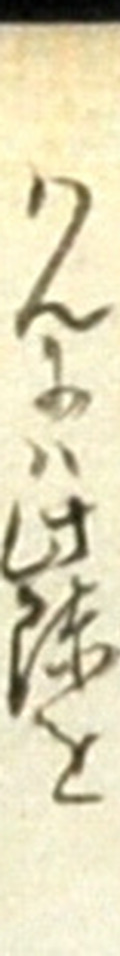はんには此陣を
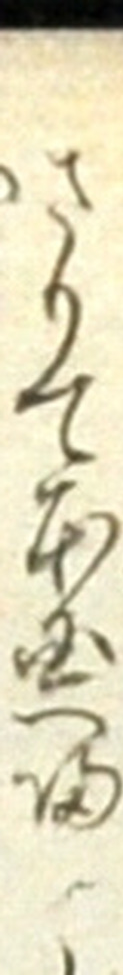さりて本国へ帰
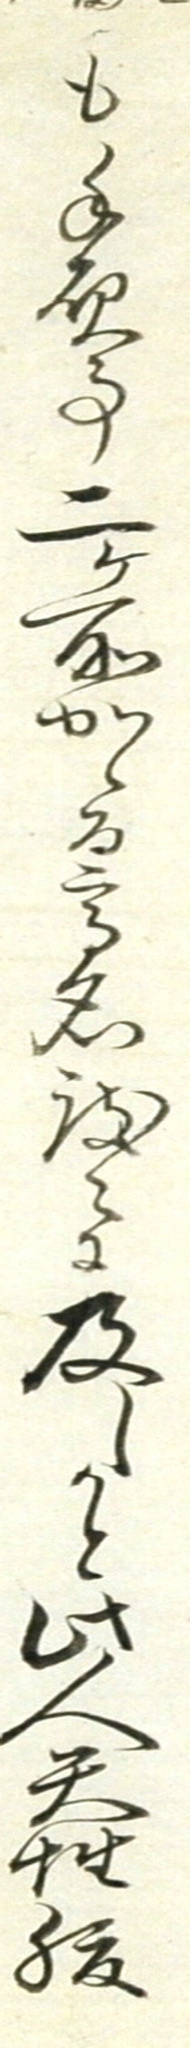も手負事二ヶ所かゝる高名度々に及しかと此人天性腹
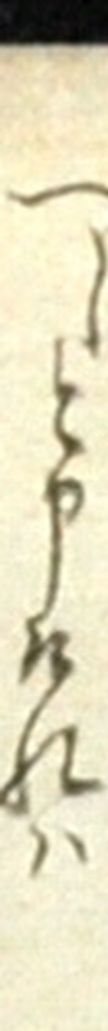へしと申けれは
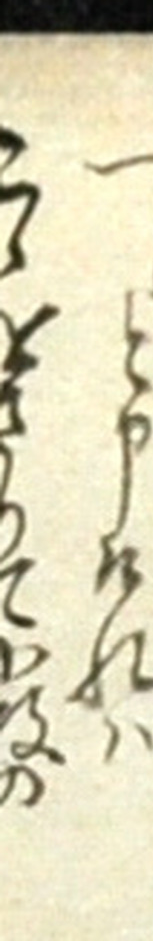こゝをさりて小牧の
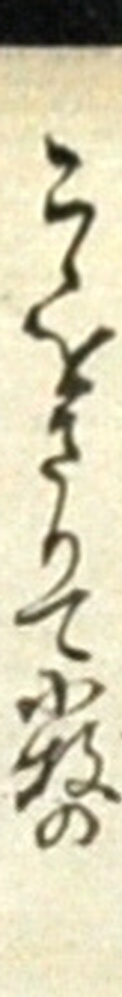こゝをさりて小牧の
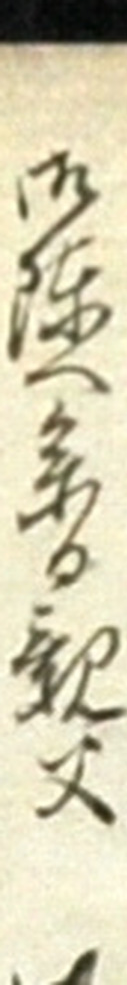御陣へ参る親父
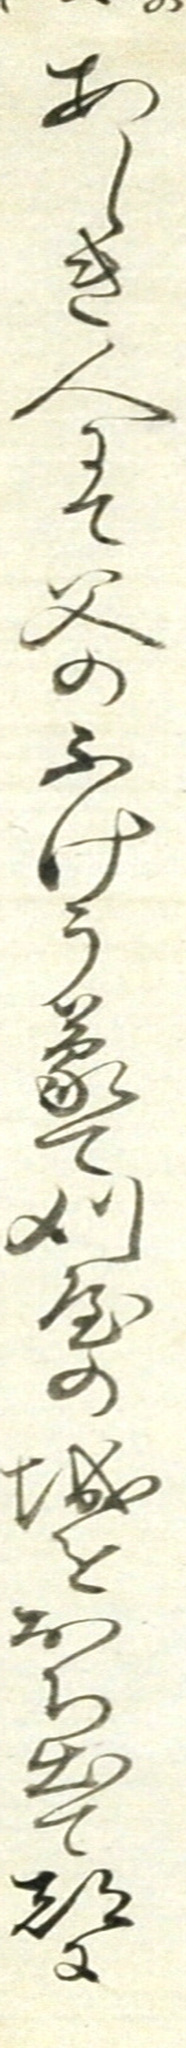あしき人にて父のふけう蒙て刈屋の城をおち出て都に
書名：藩翰譜（二・三）
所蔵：伊那市立高遠町図書館・合同会社AMANE
